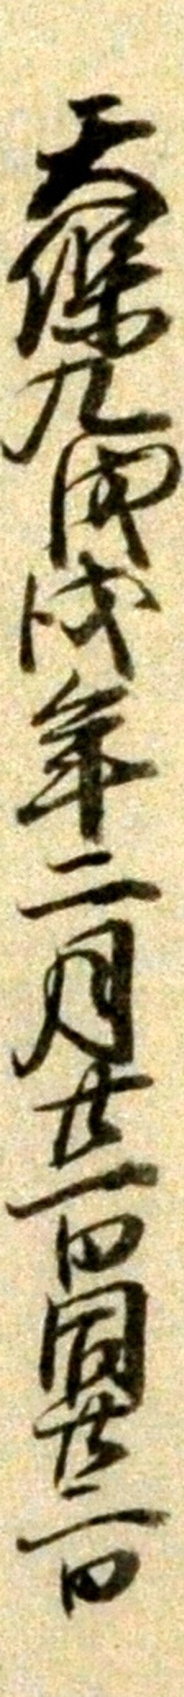天保九戊戌年二月廿一日同廿二日
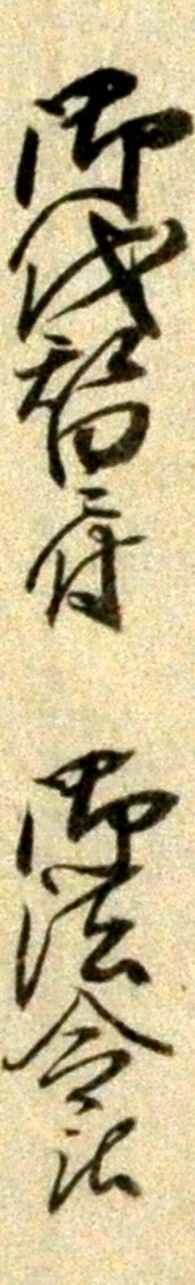御代替ニ付御法令被
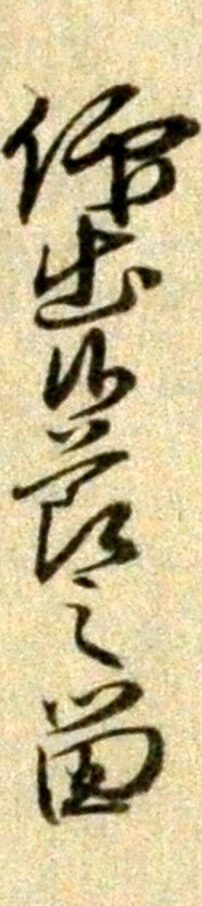仰出候節之留
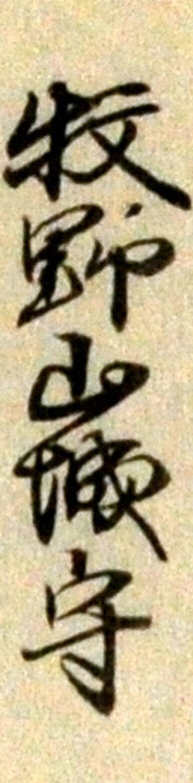牧野山城守
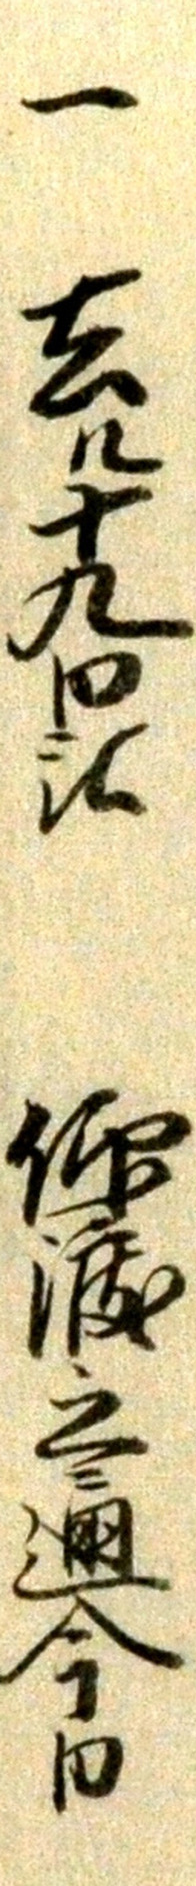一去ル十九日被仰渡之通今日
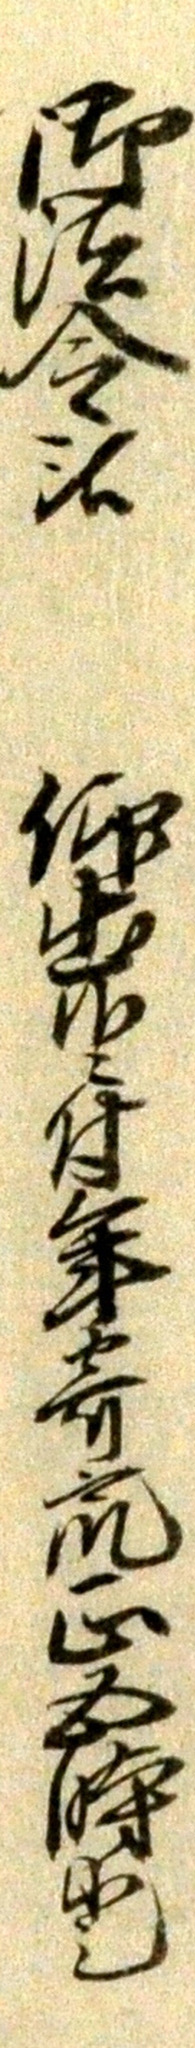御法令被仰出候ニ付年寄衆正五時登
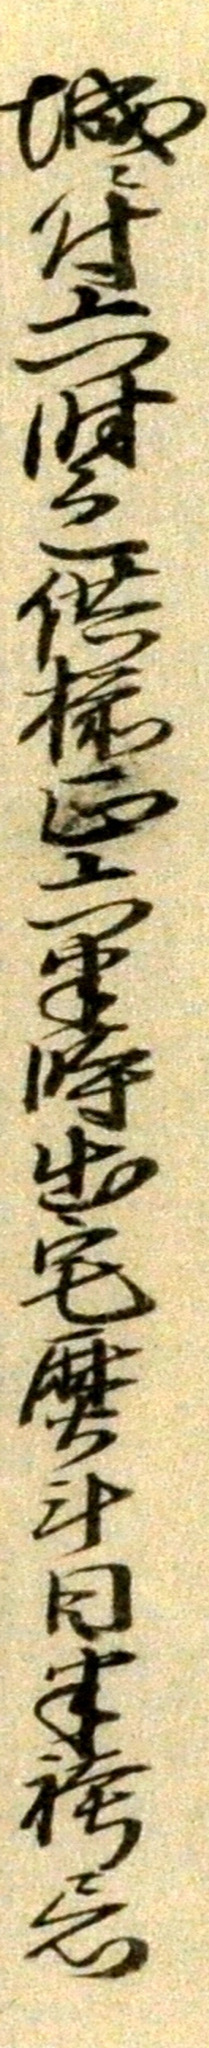城ニ付六時過供揃正六半時出宅熨斗目半袴着
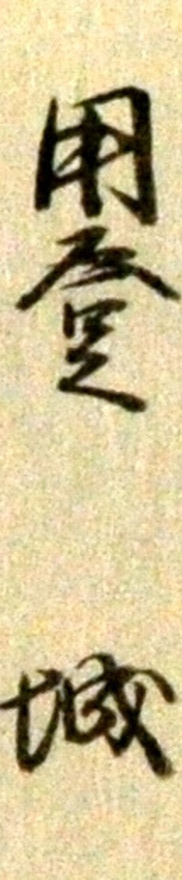用登城
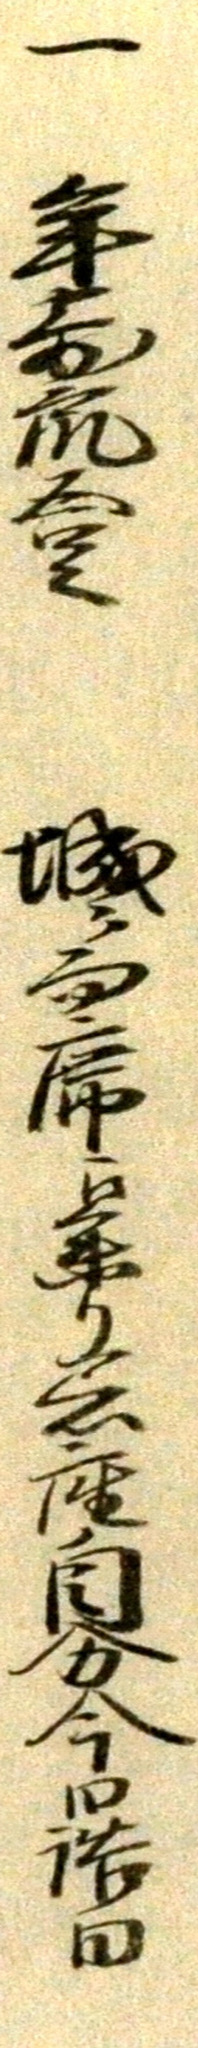一年寄衆登城ニ而席江参り着座自分今日詰日
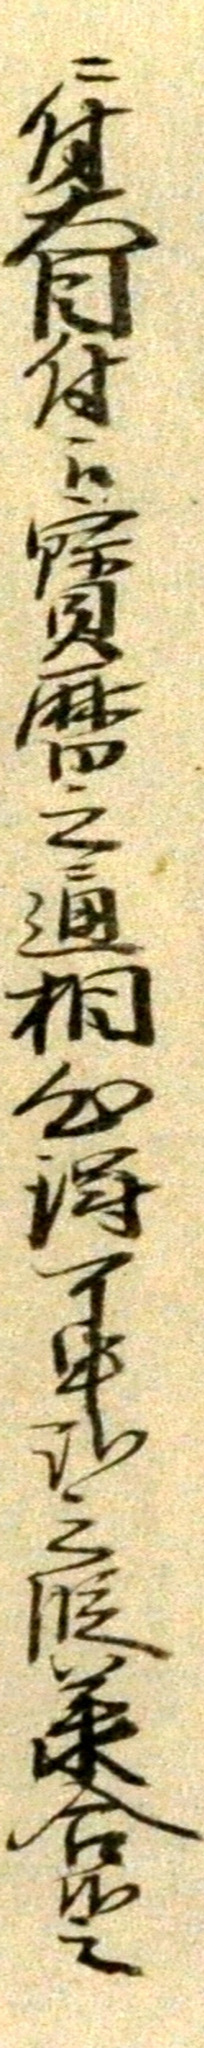ニ付大目付え宝暦之通相心得可申哉之段承合候之
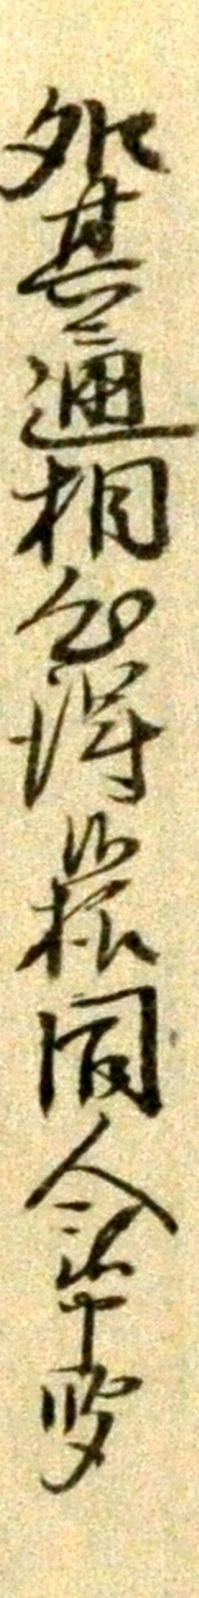処其通相心得候様同人被申聞
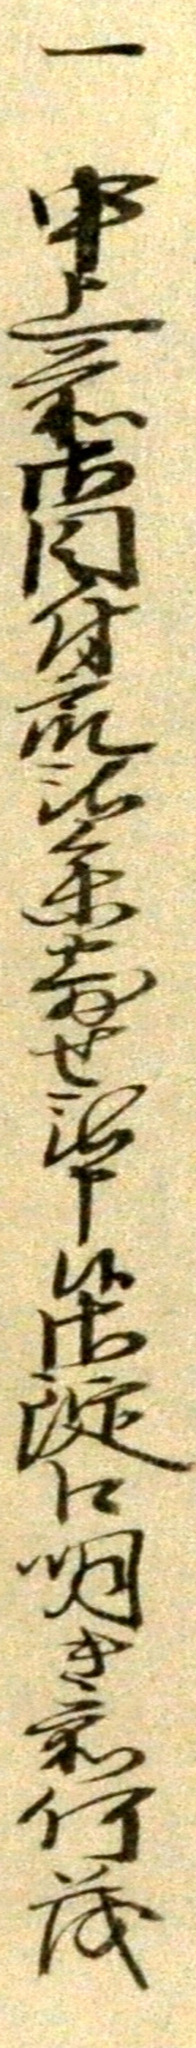一申上前御目付衆被参寄せ被申候御錠口明き前何も
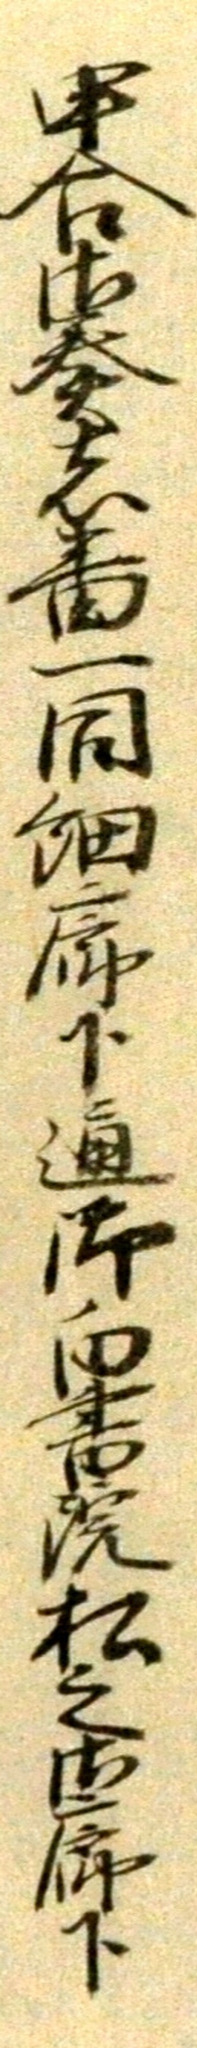申合御奏者番一同細廊下通御白書院松之御廊下
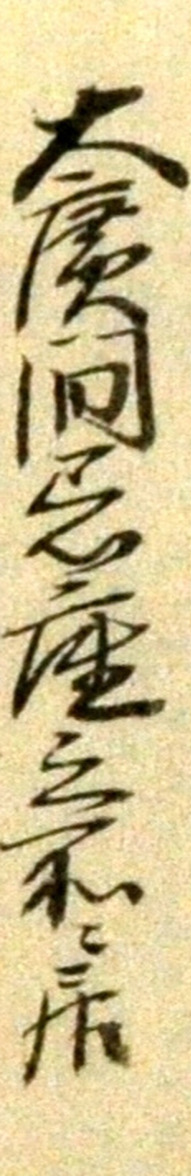大広間着座之所ニ居
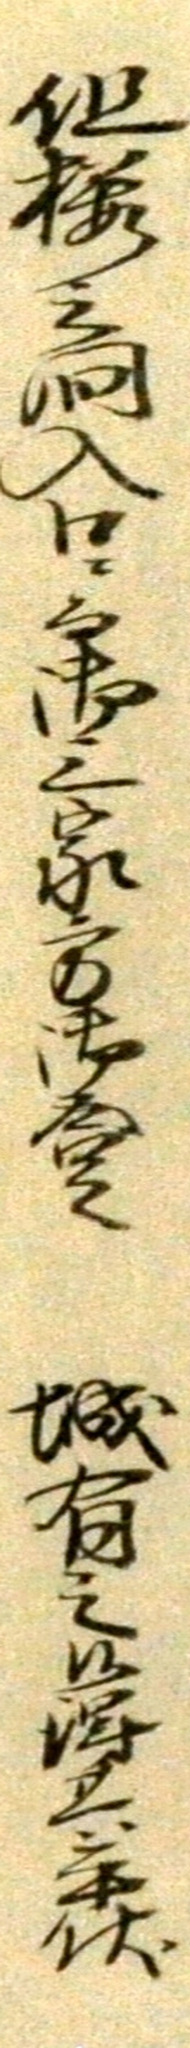但桜之間入口ニ而御三家方御登城有之候得共平伏
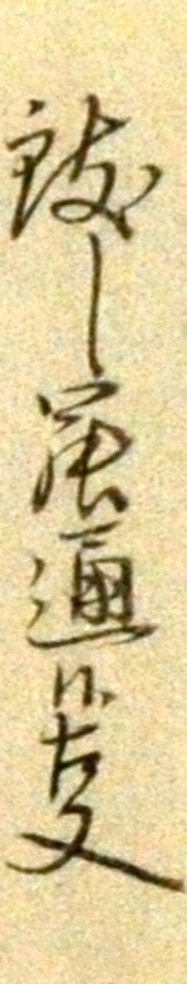致し罷通候事
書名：御代替ニ付御法令仰出サレ候節ノ留
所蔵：伊那市立高遠町図書館・合同会社AMANE
